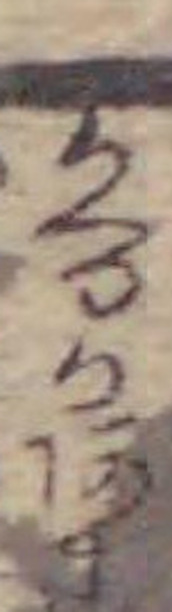かへるかあす
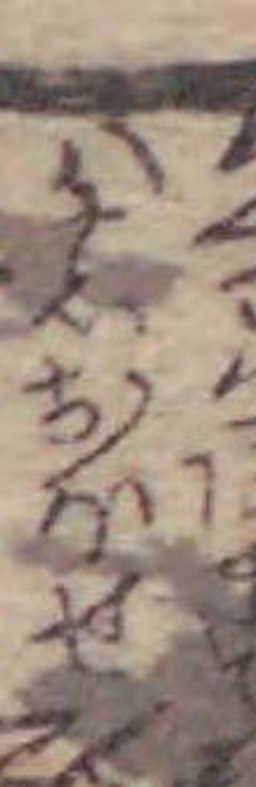はしおほせ
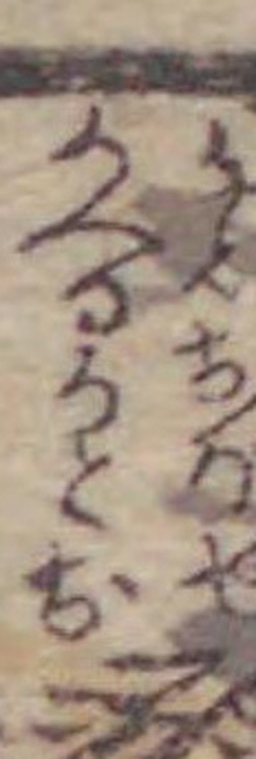かへるかとお
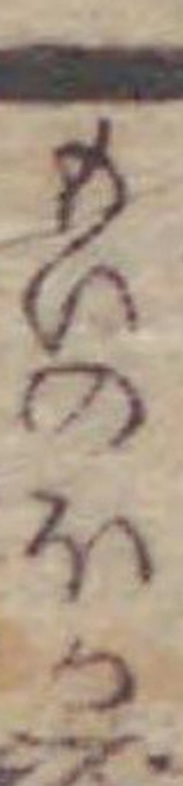もいのほか
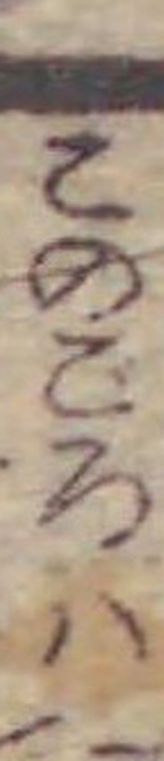このごろは
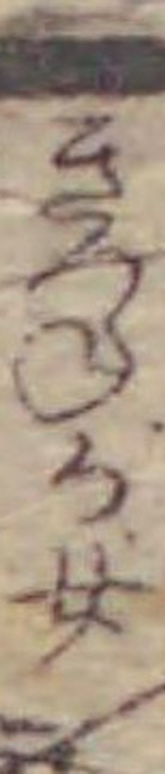きつねが女
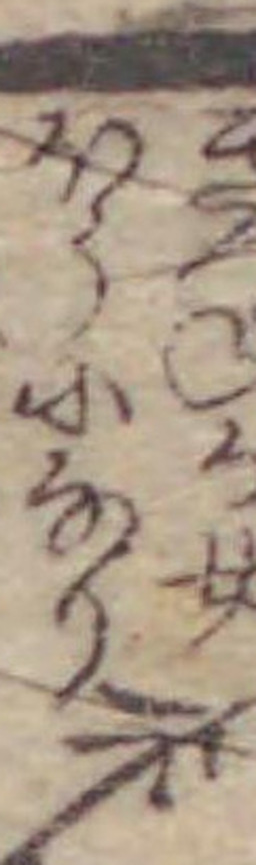ほうになり
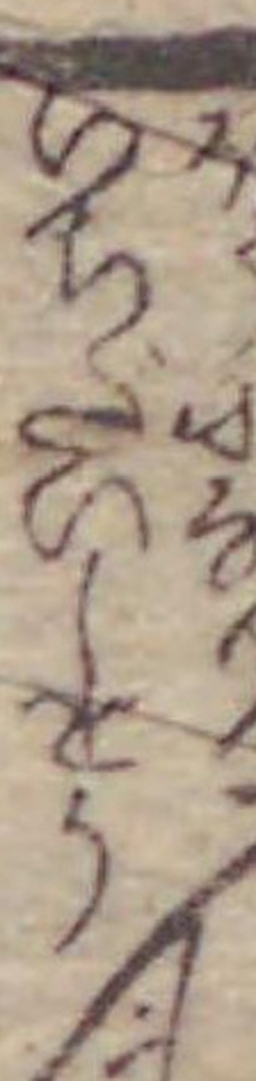いちだいしをう
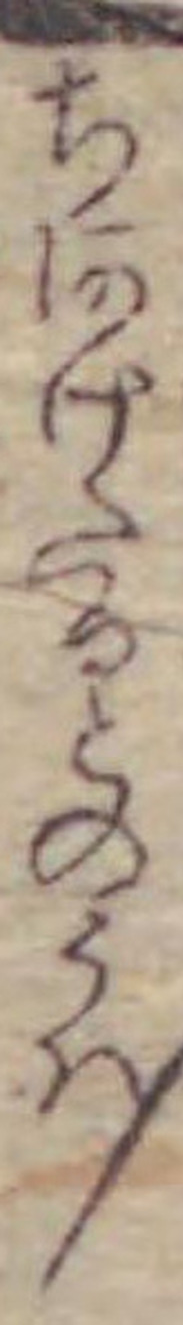ちあけたるとのうは
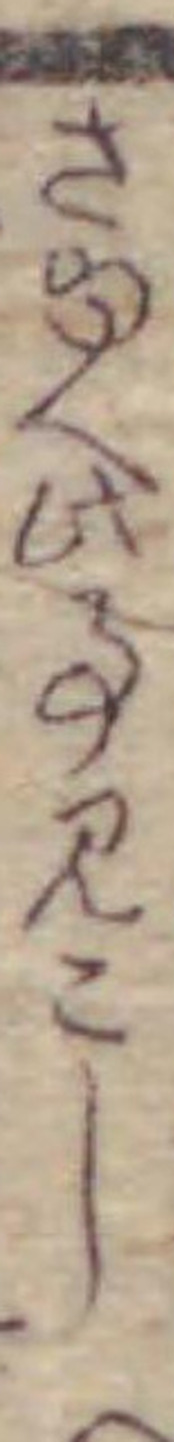さゆへ此事見こし
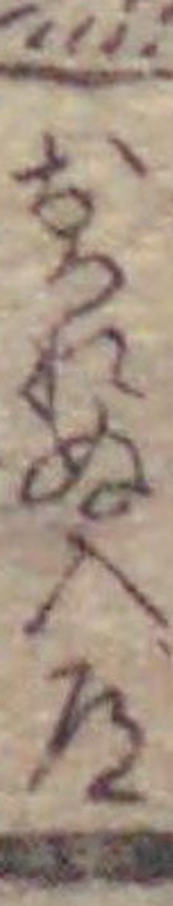おかれぬ入道
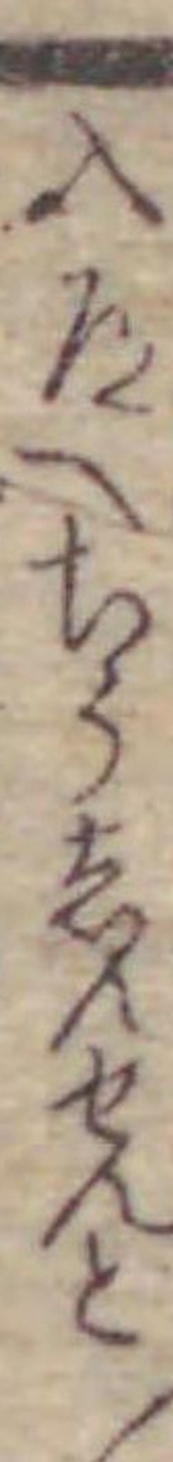入道へちうしんせんと
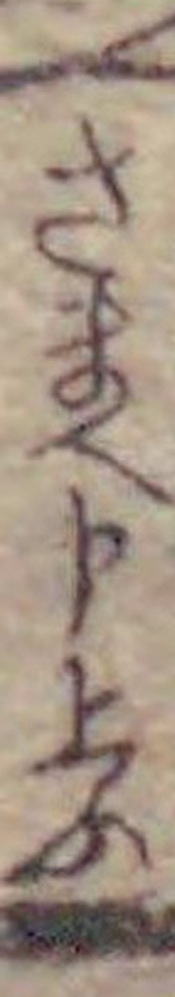さまへ申上ふ
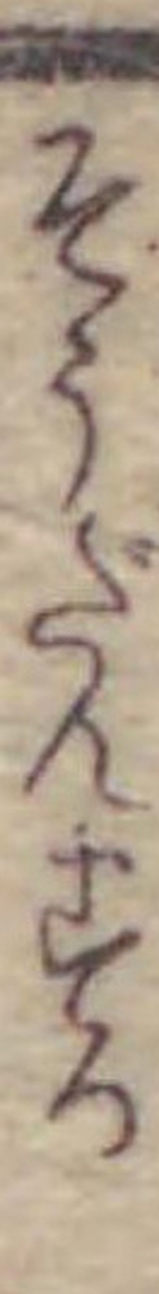そうだんする
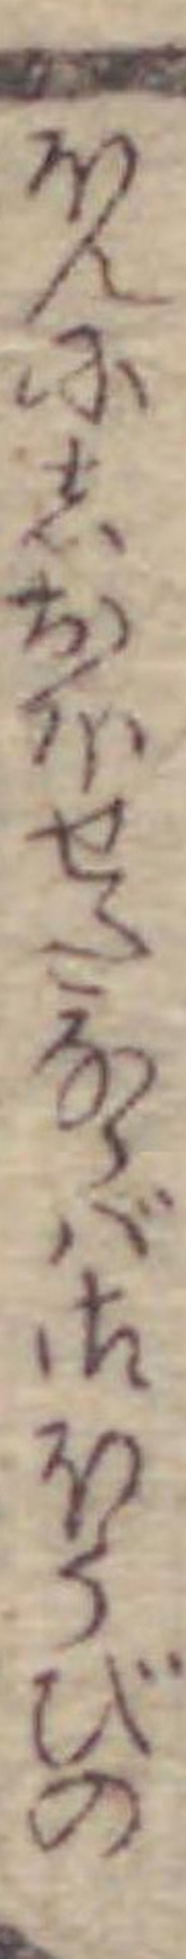ほんにしおほせたならば御ほうびの
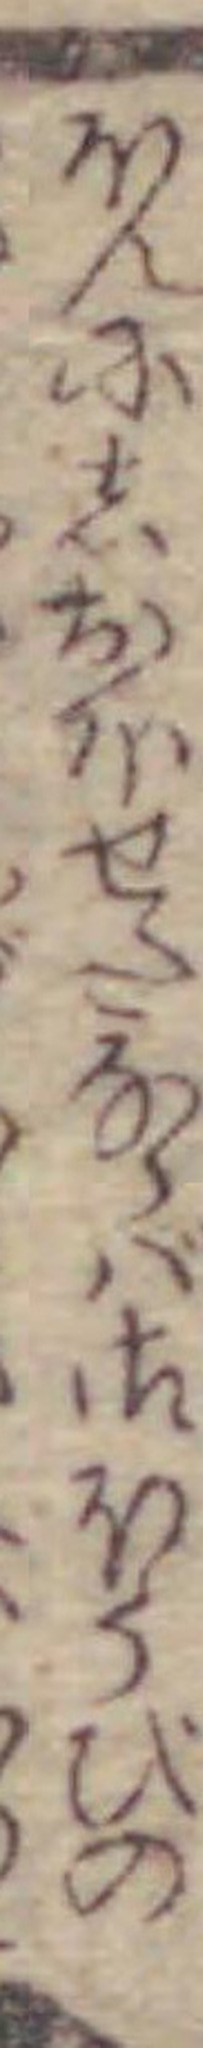ほんにしおほせたならば御ほうびの
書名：化物仲間破 : 2巻
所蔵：国立国会図書館 National Diet Library, JAPAN
